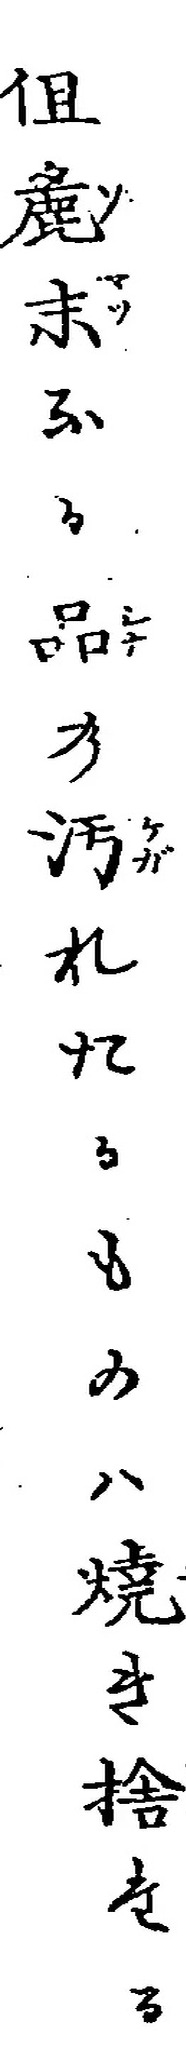但麁末なる品の汚れたるものは焼き捨たる
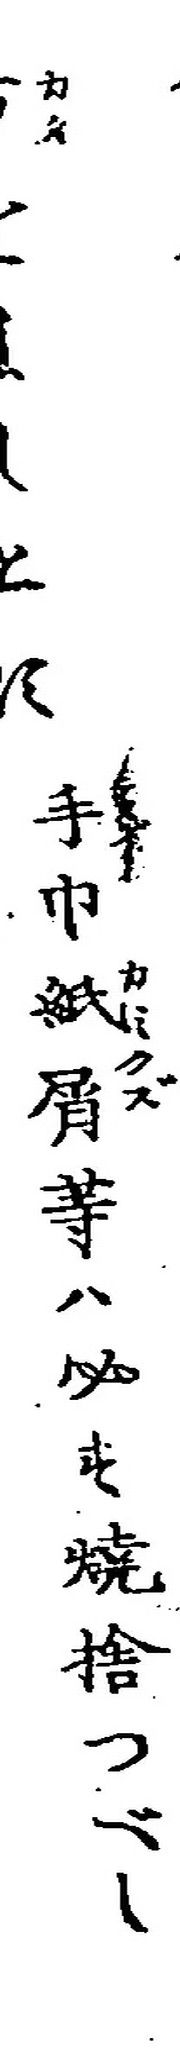方をよしとす手巾紙屑等は必す焼捨つべし

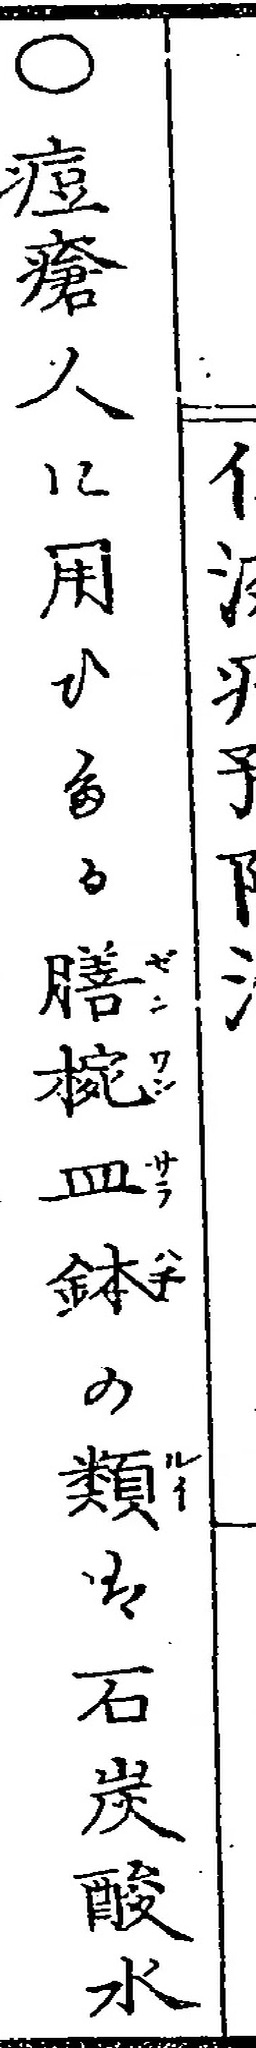○痘瘡人に用ひたる膳椀皿鉢の類は石炭酸水
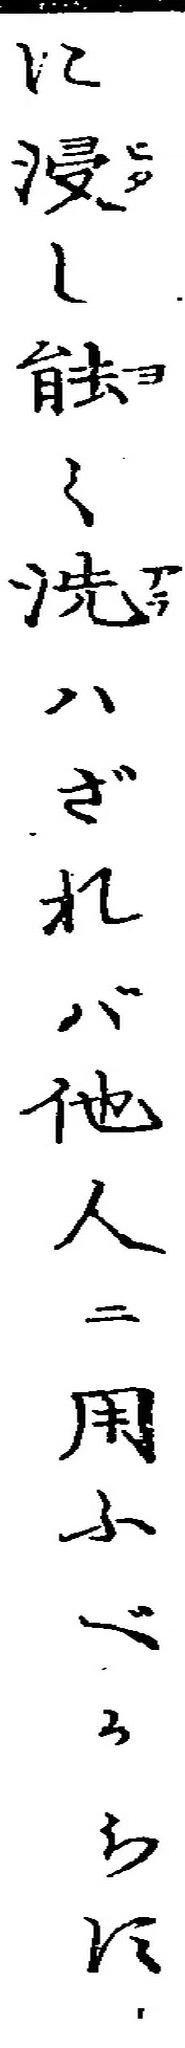に浸し能く洗はざれば他人に用ふべからす
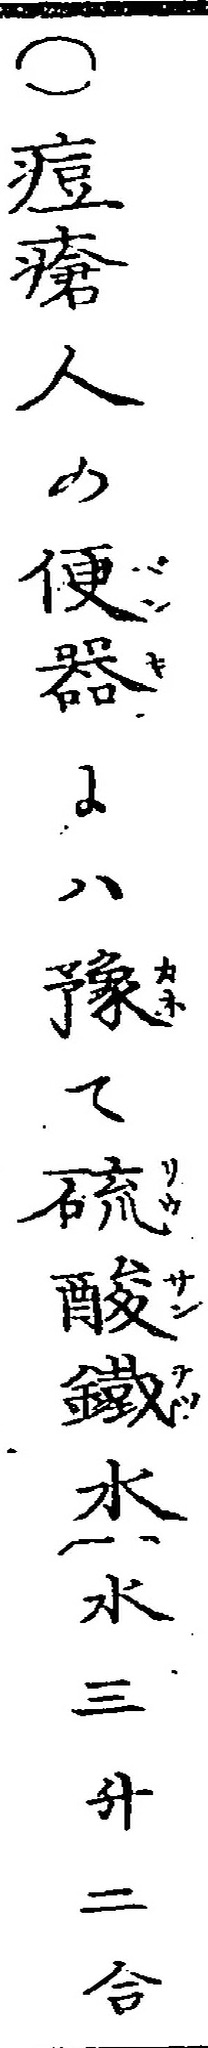○痘瘡人の便器には予て硫酸鉄水[水三升二合
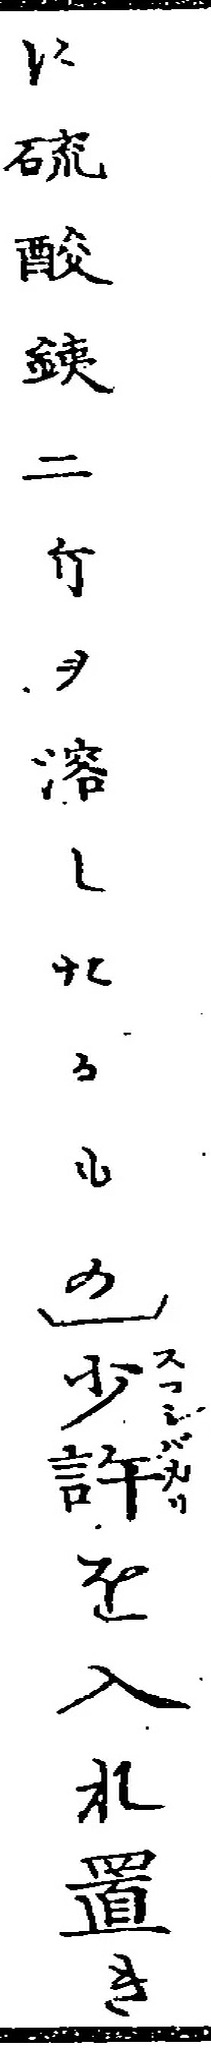に硫酸鉄二斤を溶したるもの]少許を入れ置き
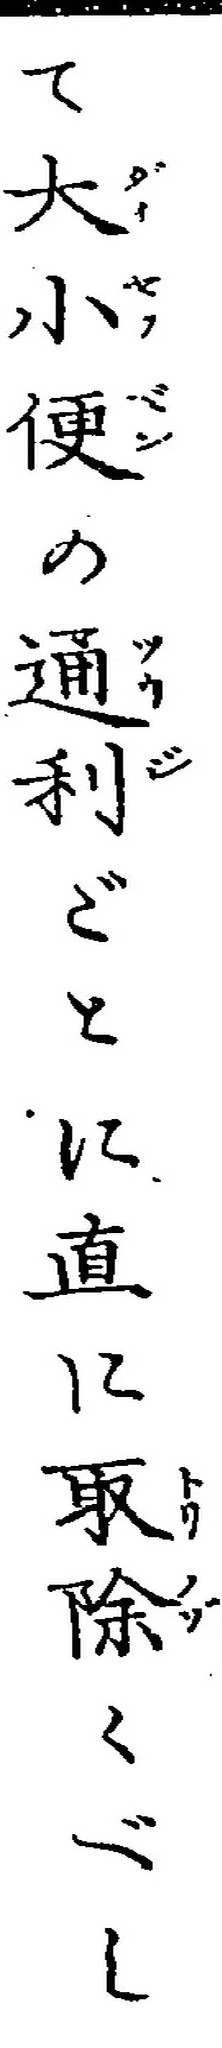て大小便の通利ごとに直に取除くべし
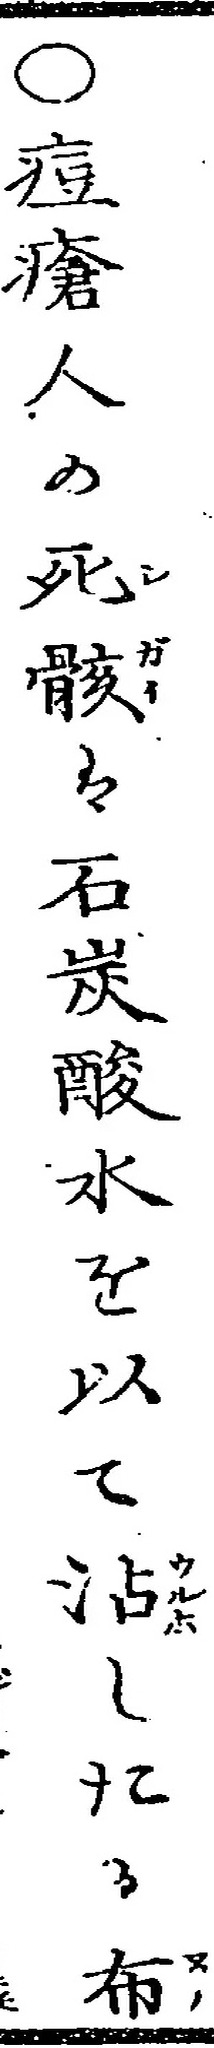○痘瘡人の死骸は石炭酸水を以て沾したる布
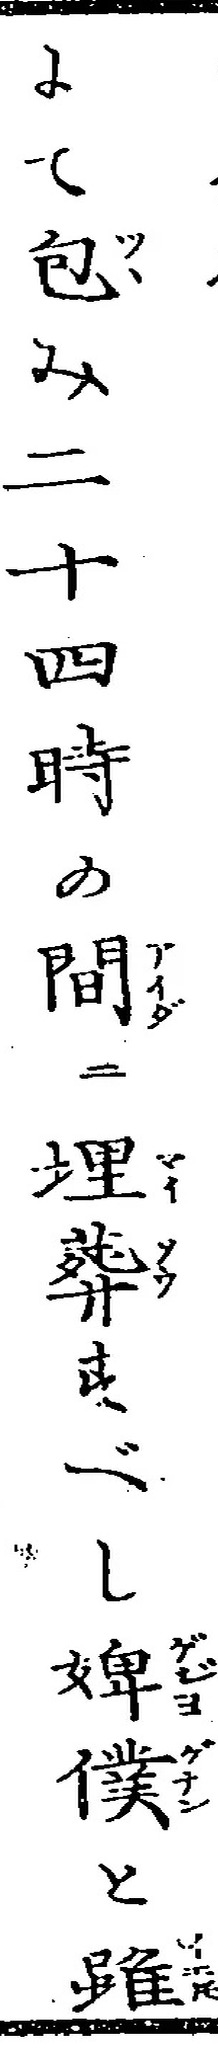にて包み二十四時の間に埋葬すべし婢僕と雖
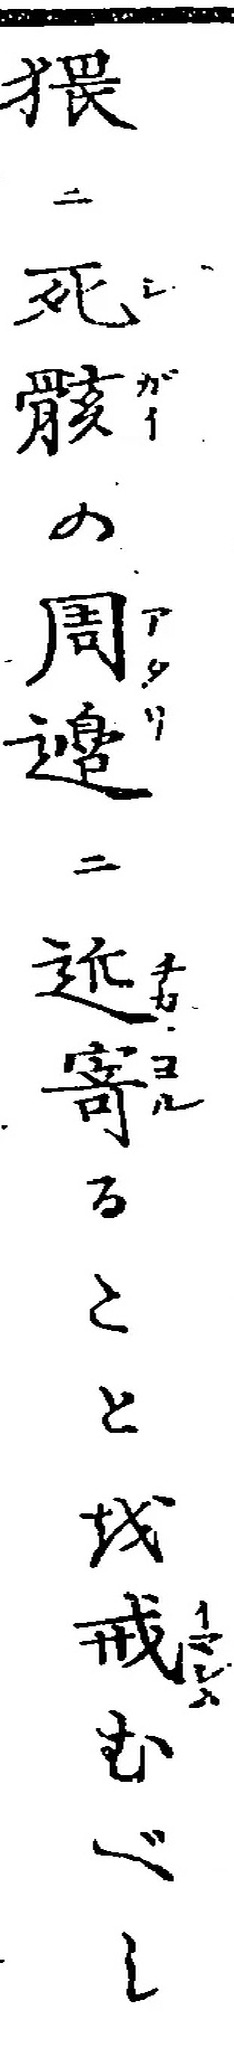猥に死骸の周辺に近寄ることを戒むべし
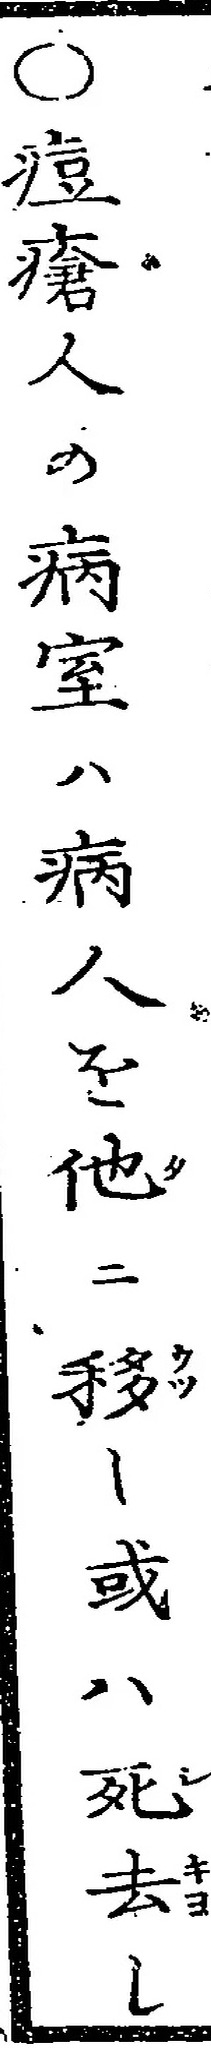○痘瘡人の病室は病人を他に移し或は死去し
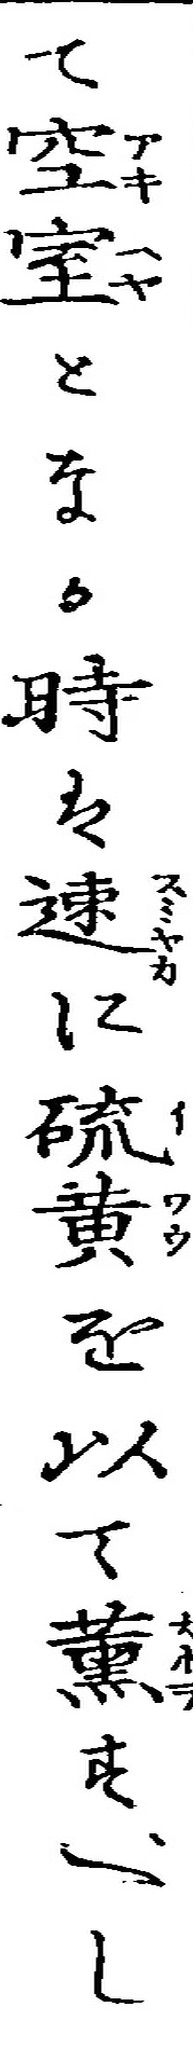て空室となる時は速に硫黄を以て薫すべし

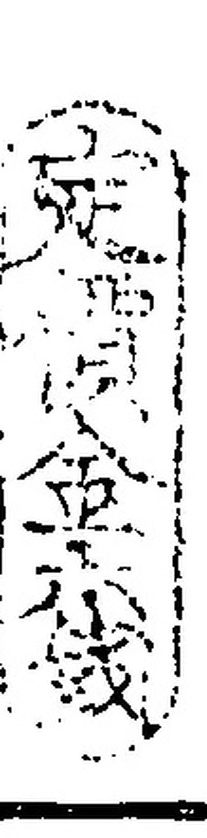定價金六銭
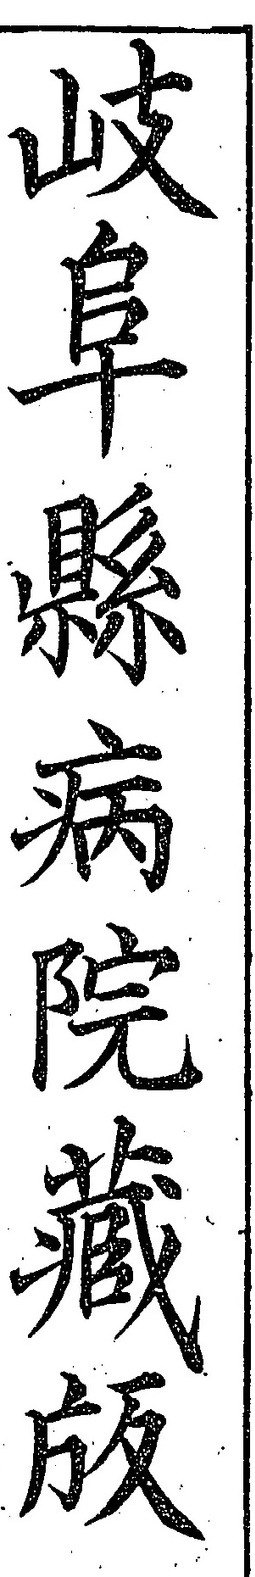岐阜県病院蔵版
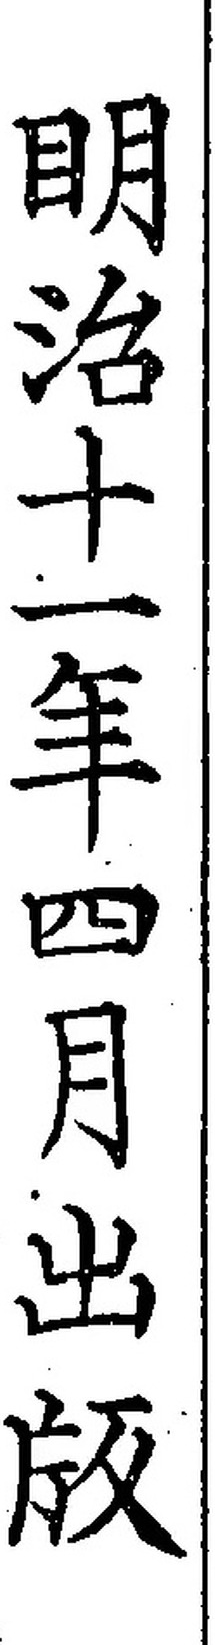明治十一年四月出版
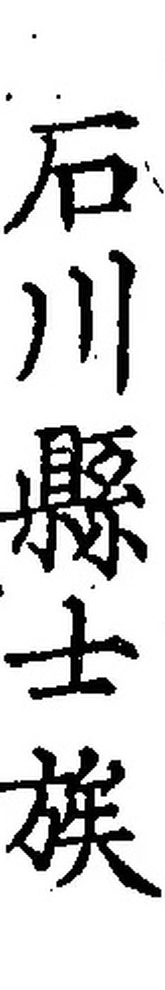石川県士族
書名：伝染病予防法
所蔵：国立国会図書館 National Diet Library, JAPAN
